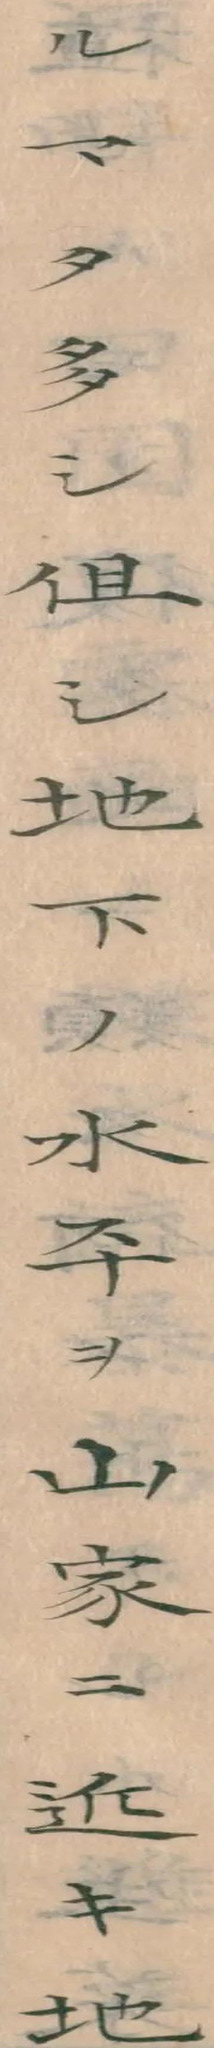ルマタ多シ但シ地下ノ水平ヲ山家ニ近キ地
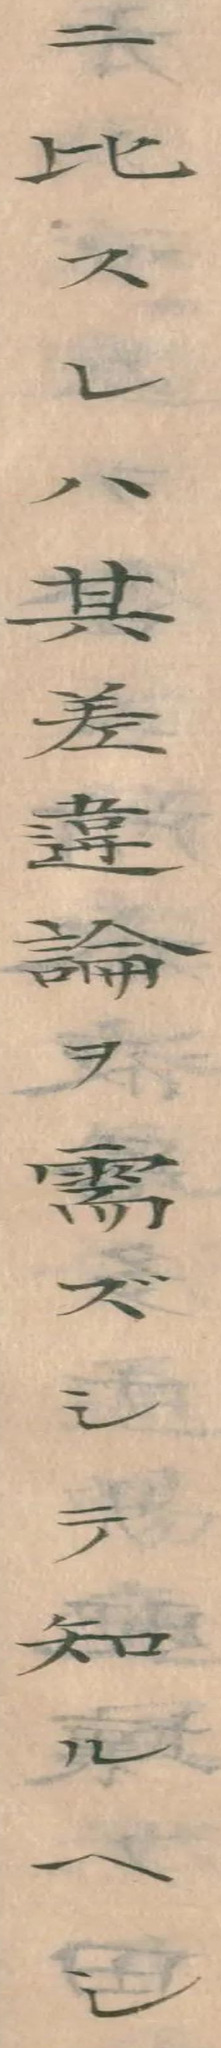ニ比スレハ其差違論ヲ需ズシテ知ルヘシ
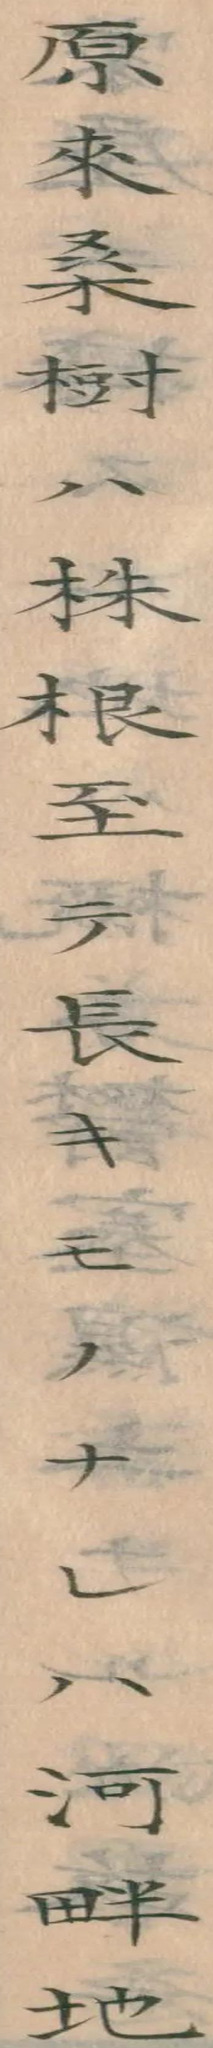原来桑樹ハ株根至テ長キモノナレハ河畔地
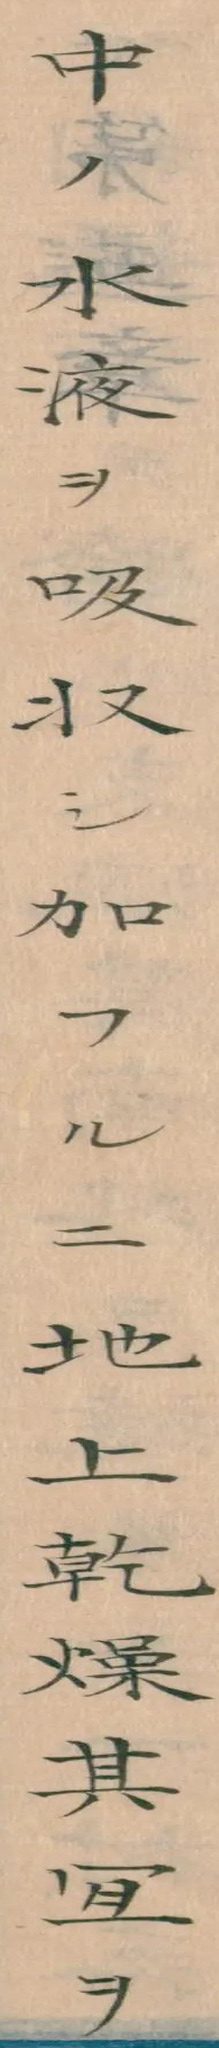中ノ水液ヲ吸収シ加フルニ地上乾燥其宜ヲ
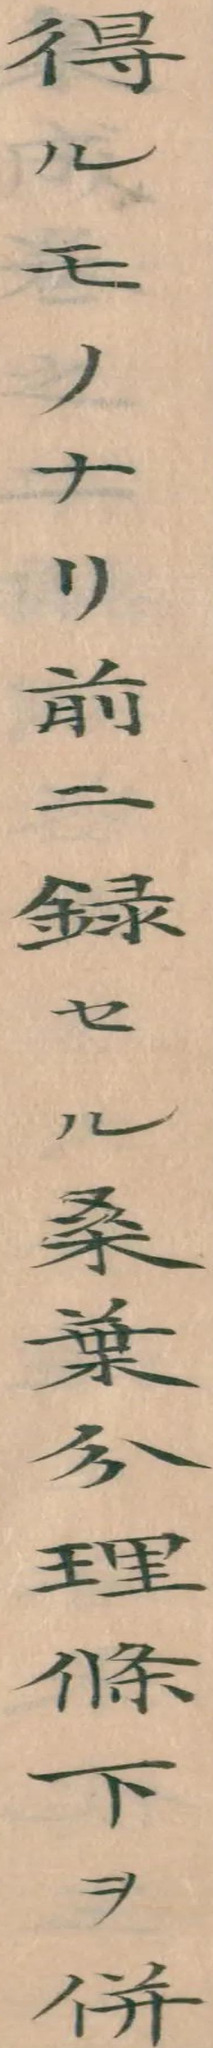得ルモノナリ前ニ録セル桑葉分理条下ヲ併
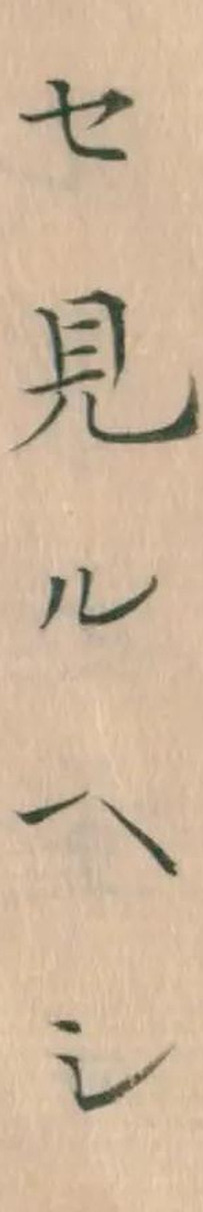セ見ルヘシ
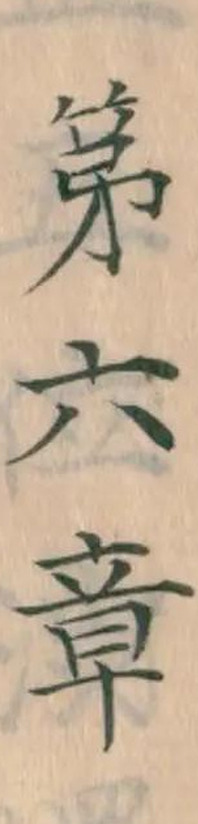第六章
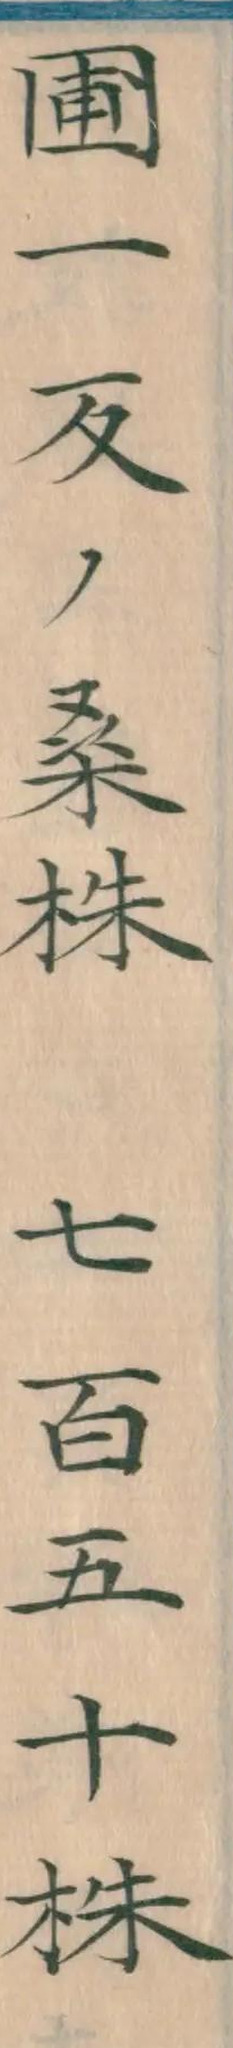圃一反ノ桑株七百五十株
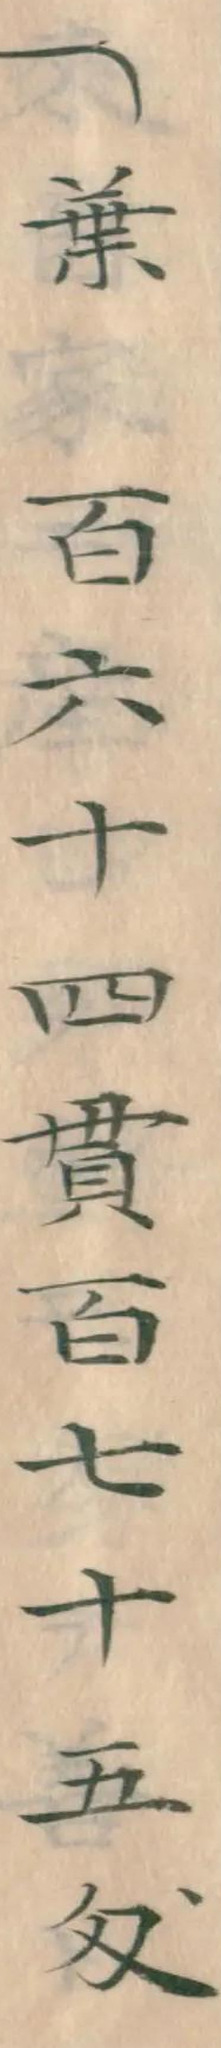┌葉百六十四貫百七十五匁

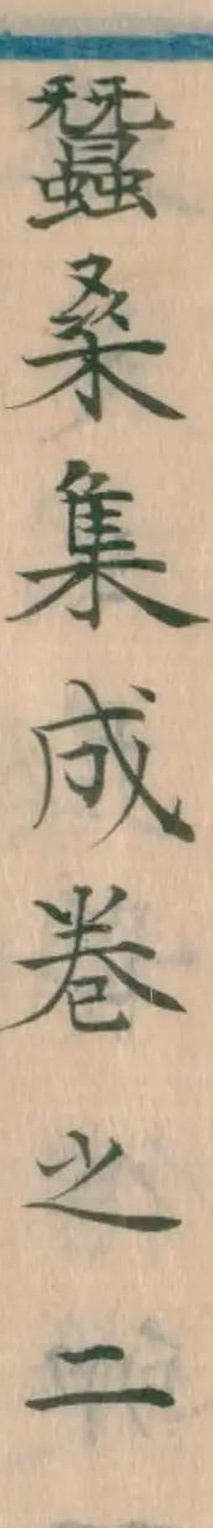蚕桑集成巻之二
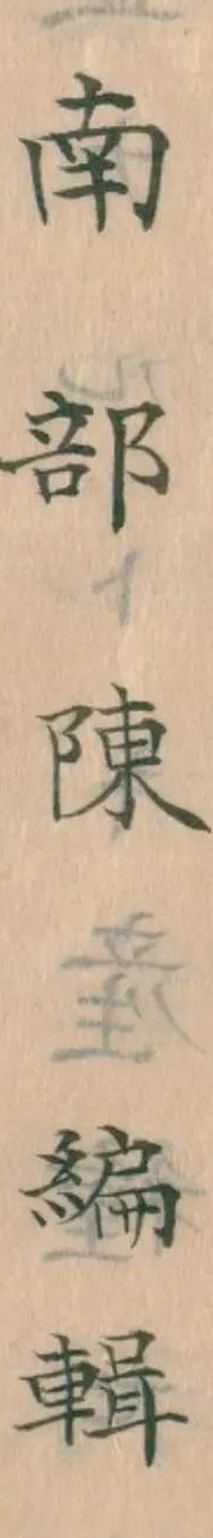南部陳編輯
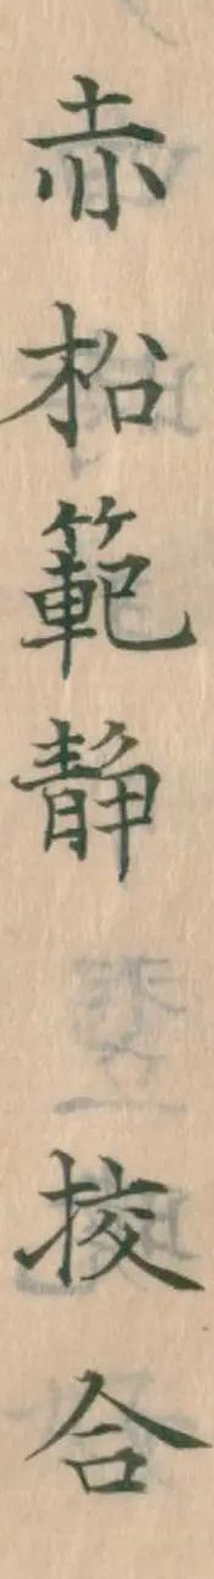赤柗範静挍合
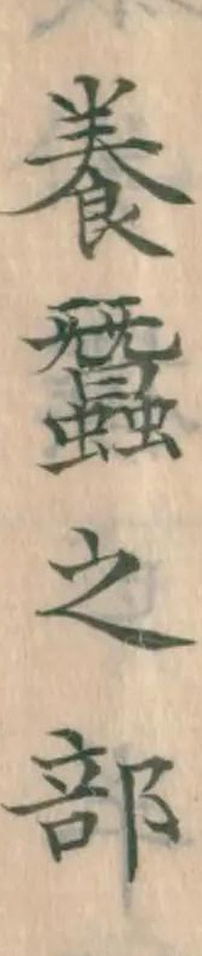養蚕之部
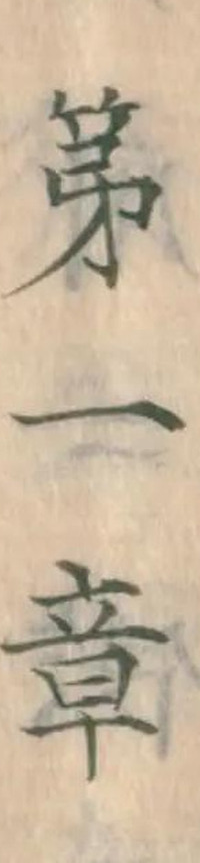第一章
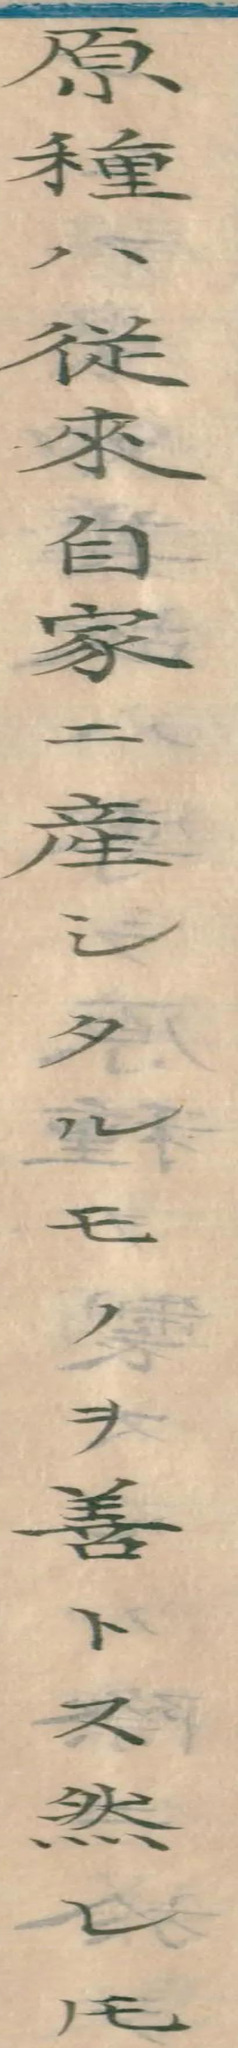原種ハ従来自家ニ産シタルモノヲ善トス然レトモ
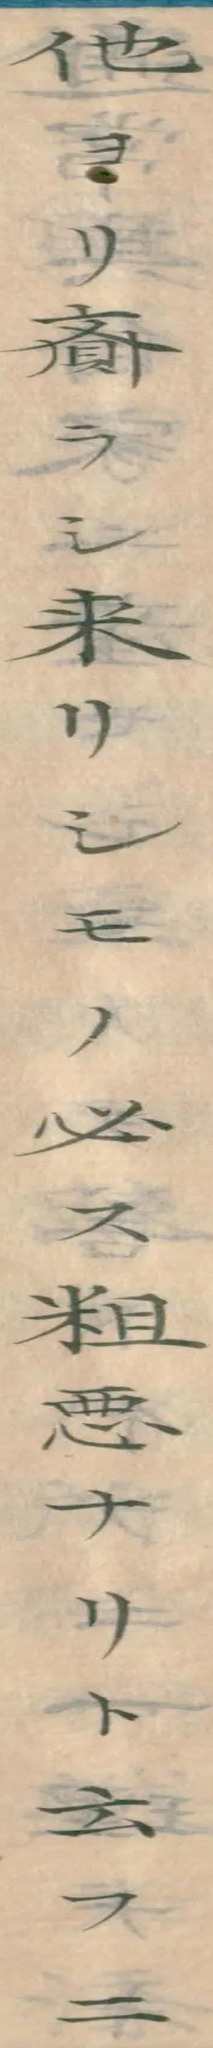他ヨリ齎ラシ来リシモノ必ス粗悪ナリト云フニ
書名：蚕桑集成
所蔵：国立国会図書館 National Diet Library, JAPAN
